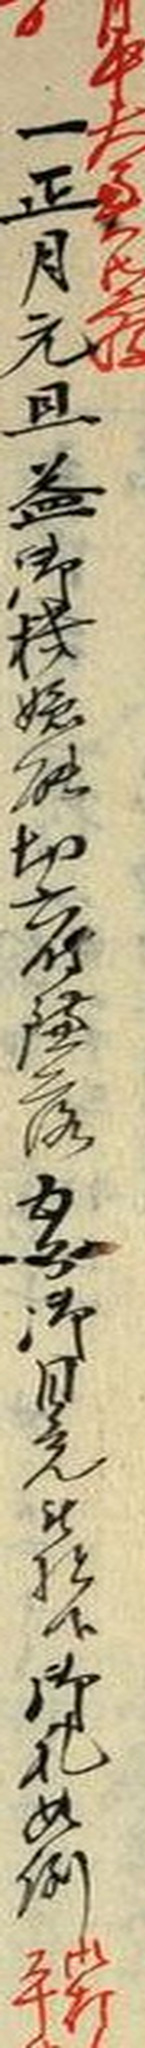一正月元旦益御機嫌能切六時鎌落五分御目覚被遊候御礼如例
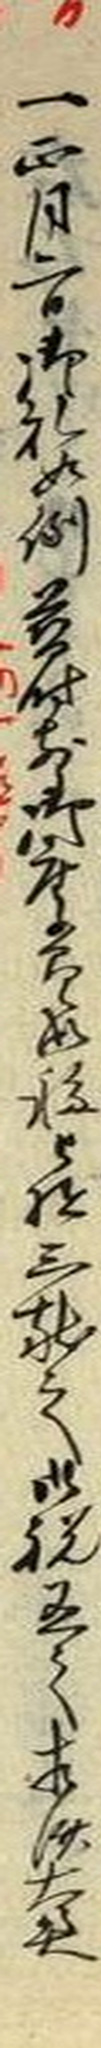一正月二日御礼如例暮時前御座之間へ御移被遊三献之御祝有之相済大奥
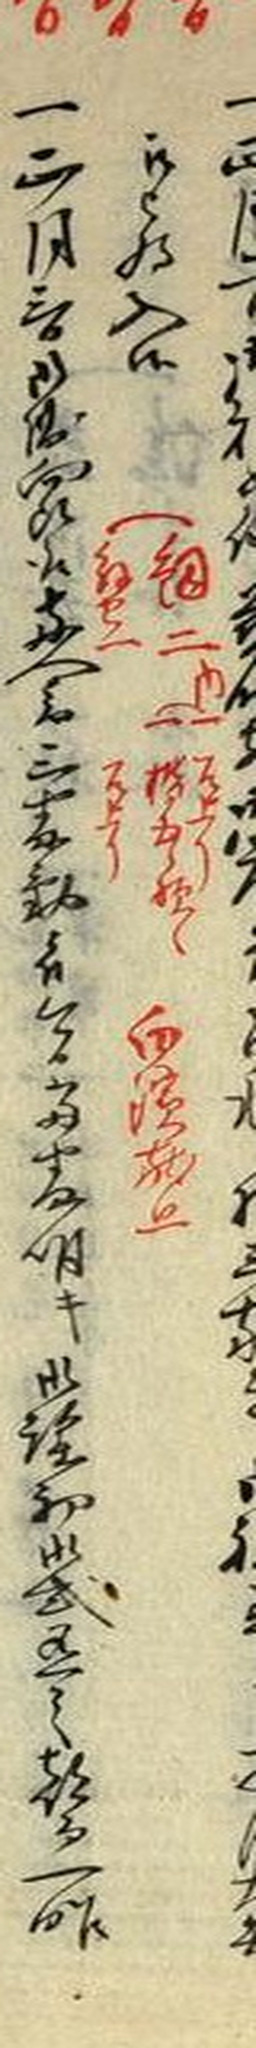一正月三日御側向頭取両人ニ而三番勤ニ付今日当番明キ御謡初御式有之都而一昨
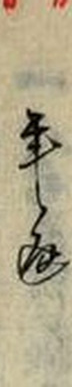年之通
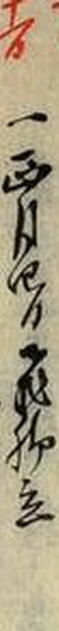一正月四日飛脚立
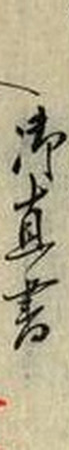御直書
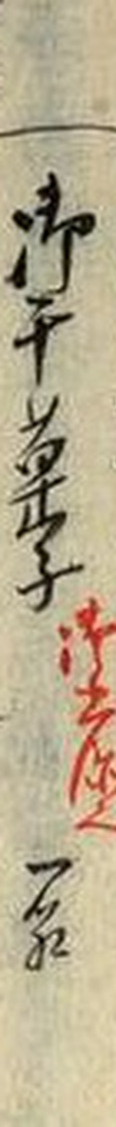御干菓子一箱
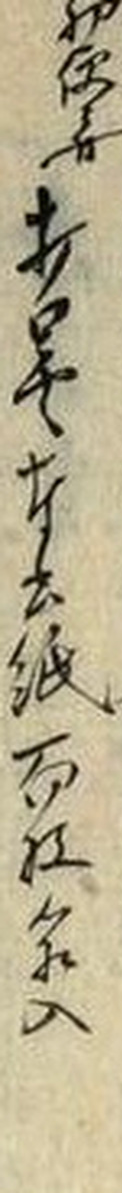打曇奉書紙百枚箱入
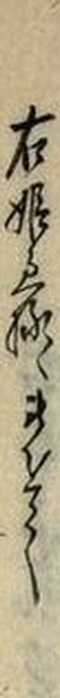右姫君様へ被進之
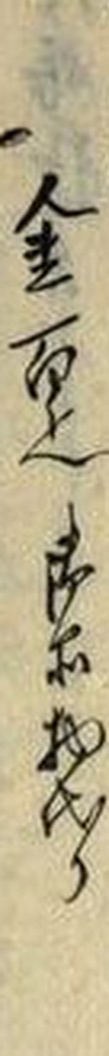金百疋御品物代り
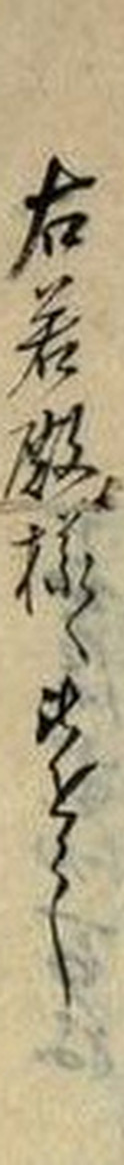右若殿様へ被進之

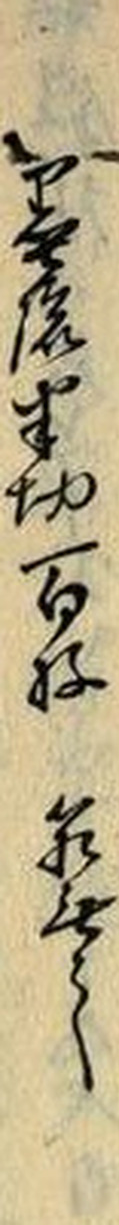墨流半切百枚箱無之
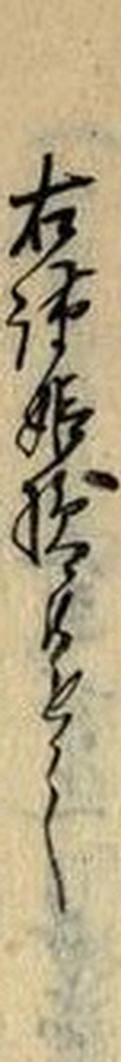右謹姫様へ被進之
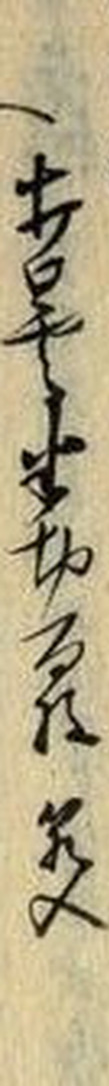打曇半切百枚箱入
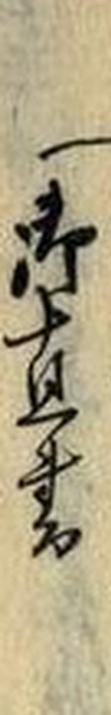御直書
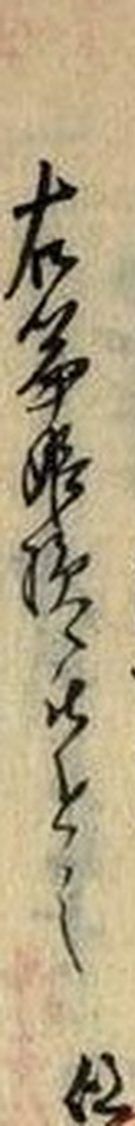右謹姫様へ被進之
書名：少傅日録抄（斉承付側向頭取日記、在国）
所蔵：福井県文書館 Fukui Prefectural Archives
